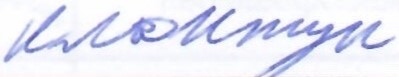клоктун
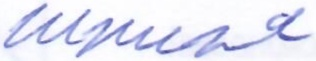сипигя
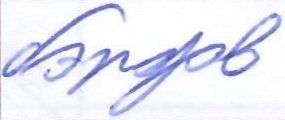бэрдов
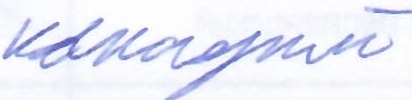канадкий
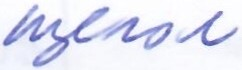щегол
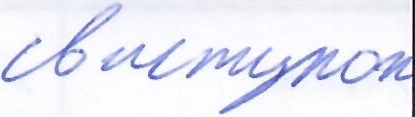свистунок
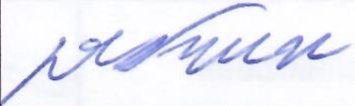рябчик
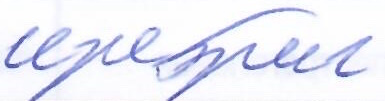серебрис
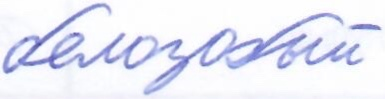белозобый
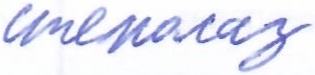стенолаз
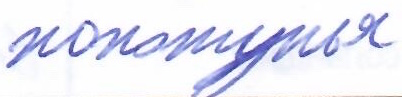хохотунья
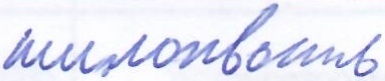шилохвость
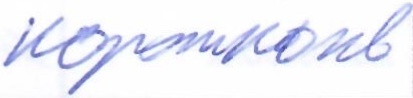короткохв
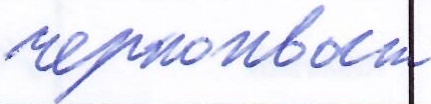чернохвост
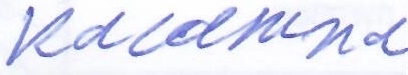касатпа
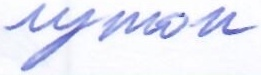луток
